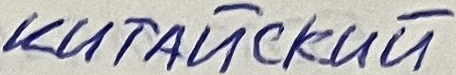китайский
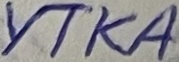утка
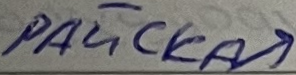райская
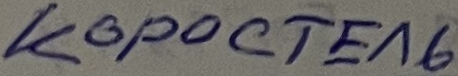коростель
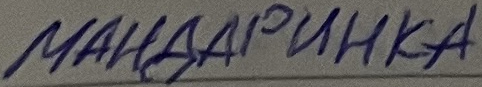мандаринка
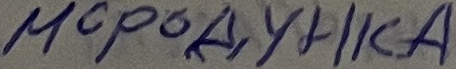мородунка
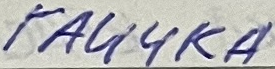гаичка
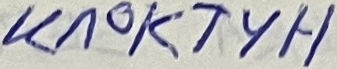клоктун
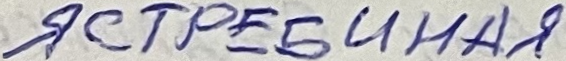ястребиная
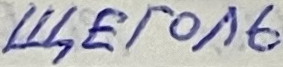щеголь
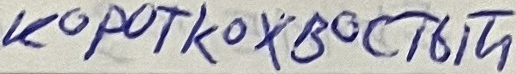короткохвостый
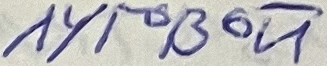луговой
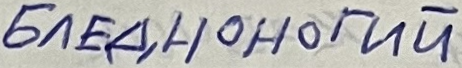бледноногий
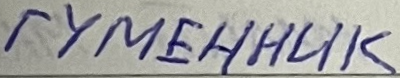гуменник
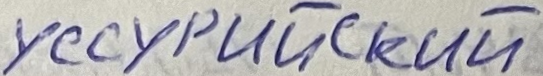уссурийский
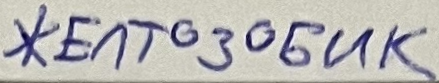желтозобик
